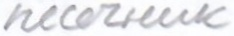песочник
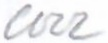сыч
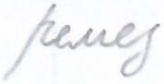ремез
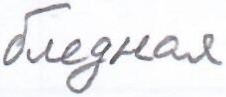бледная
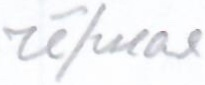чёрная
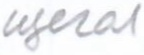щегол
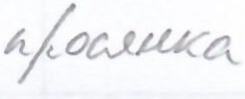просянка
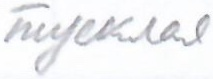тусклая
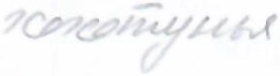хохотунья
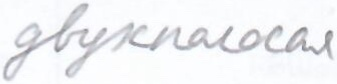двухполосая
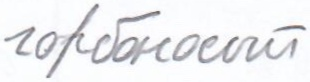горбоносый
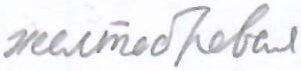желтобровая
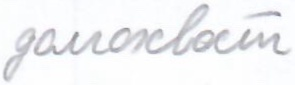долгохвост
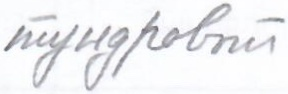тундровый
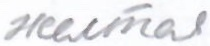желтая
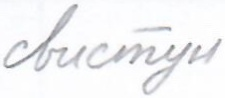свистун
